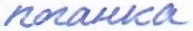поганка
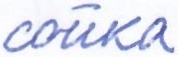сойка
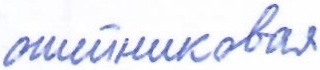ошейниковая
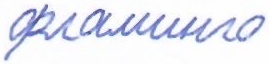фламинго
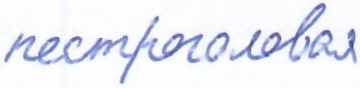пестроголовая
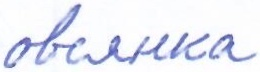овсянка
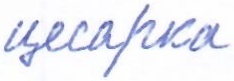цесарка
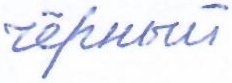чёрный
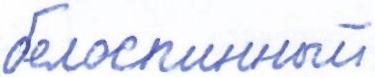белоспинный
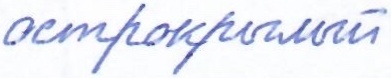острокрылый
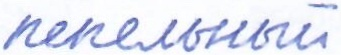пепельный
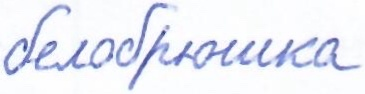белобрюшка
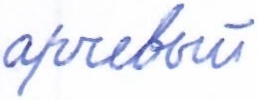арчевый
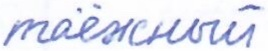таёжный
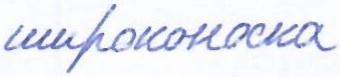широконоска
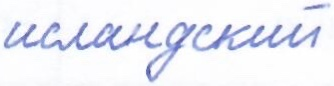исландский
